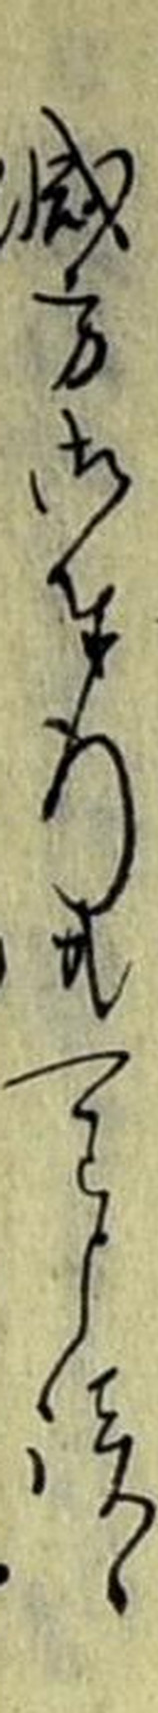減方御奉行共可被申談候
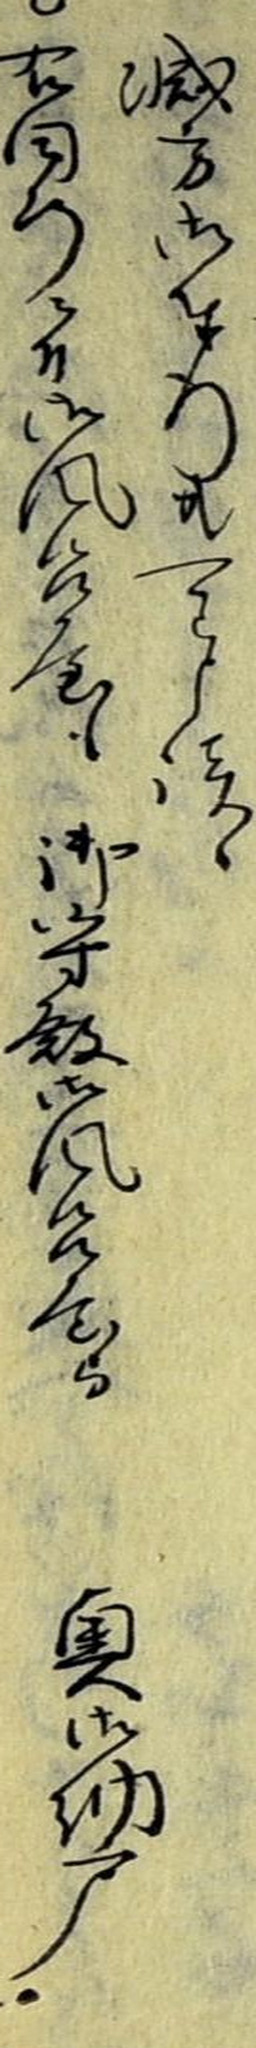〇右同断に付御風呂屋も御守殿御風呂屋与奥御納戸

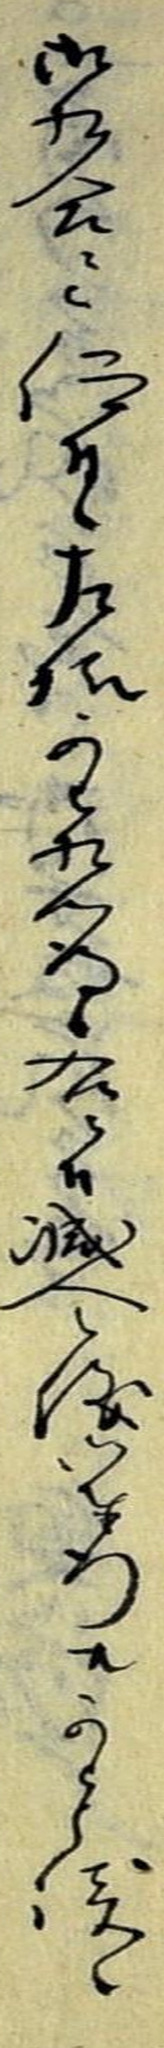御相合に被仰付候左様可被相心得候右に付減人之儀御奉行共可被申談候
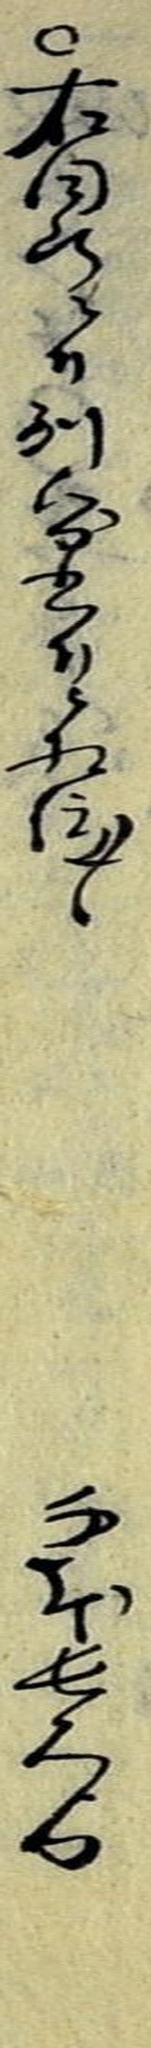〇右同断に付別紙書付被相渡候千本長右衛門
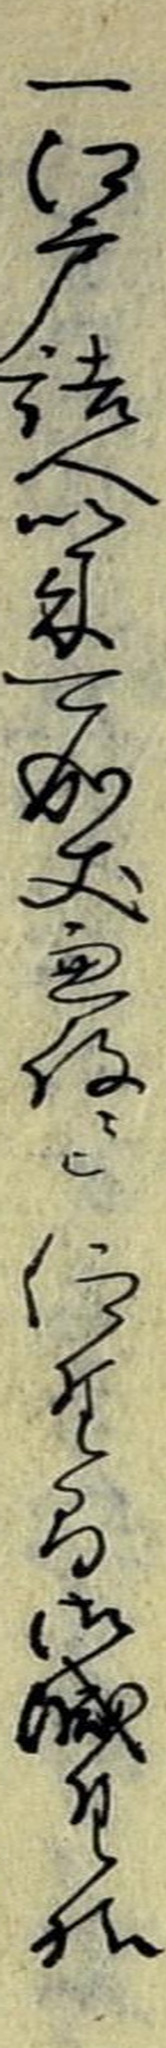一江戸詰人以来可成丈兼役に被仰付候間御減付候様
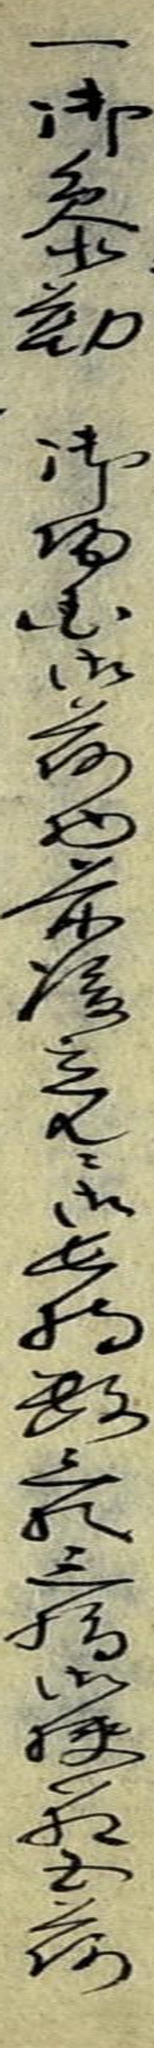一御参勤御帰国御荷物前後立共に御長持数三拾三指御挟箱五荷
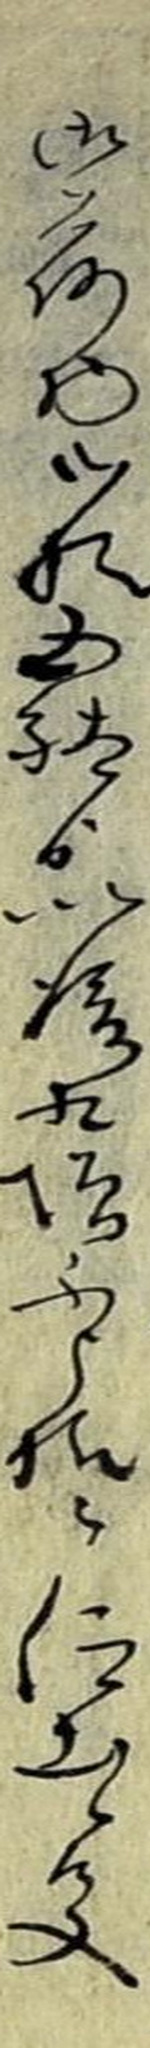御荷物弐拾五駄ゟ以後相増不申様被仰出候事
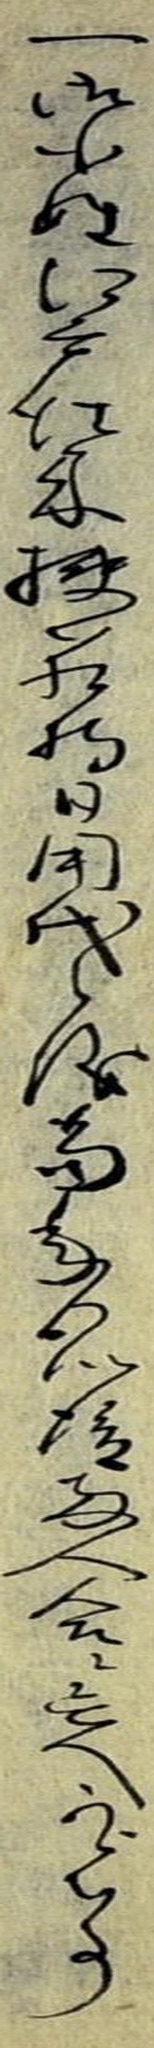一御小姓江戸往来挟箱持日用代之儀当年ゟ以後両人合に壱人可被下事
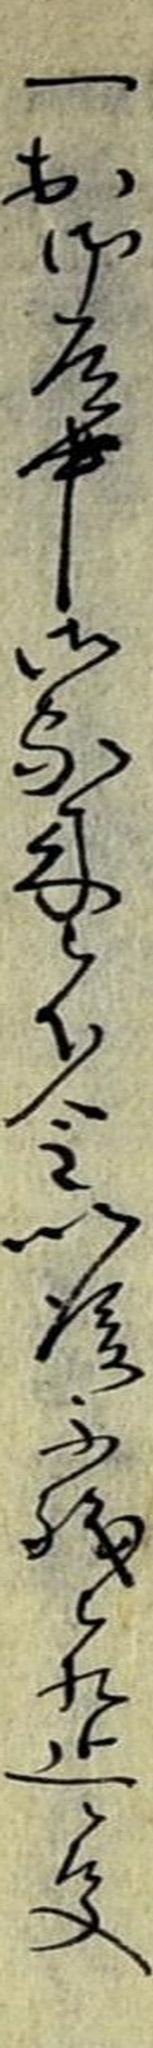一於御道中御家来被下金以後不残被相止候事
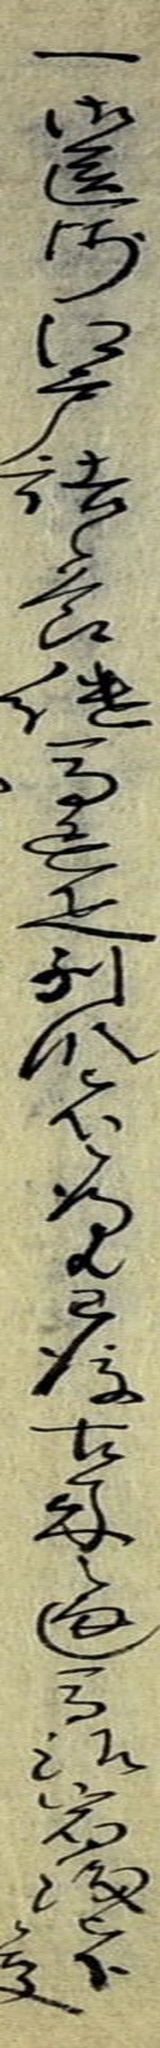一御医師江戸詰之節継馬壱疋別段被下候得共已後古来之通馬銀宿銭被下候事
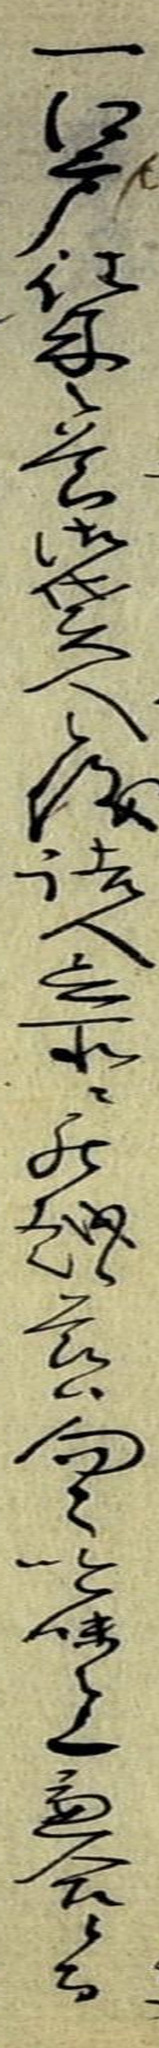一江戸往来之節御貸人之儀詰人壱所に罷越候節は向々吟味之上兼合に而
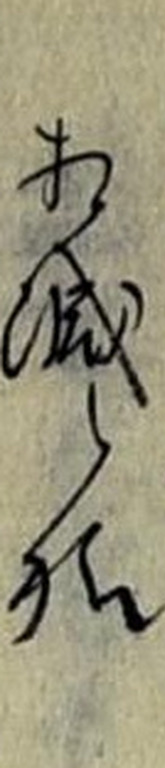相減候様
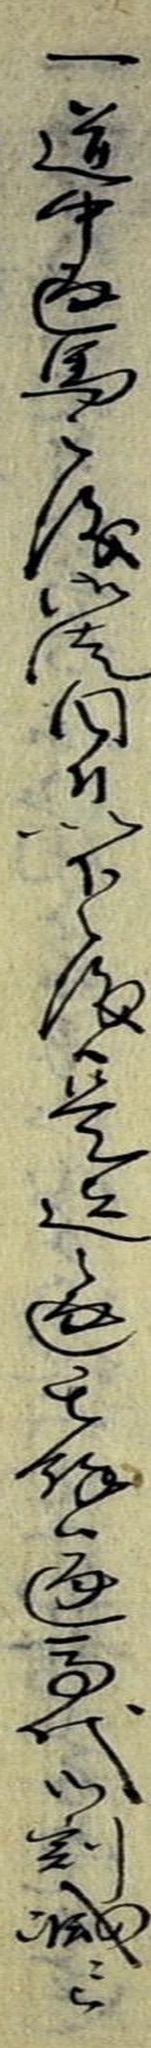一道中返馬之儀御徒目付以下之儀は是迄之通其余は返馬代御割減に被
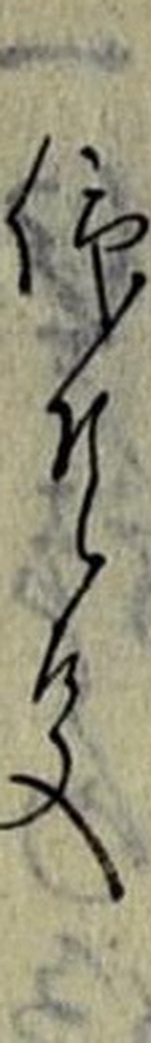仰付候事
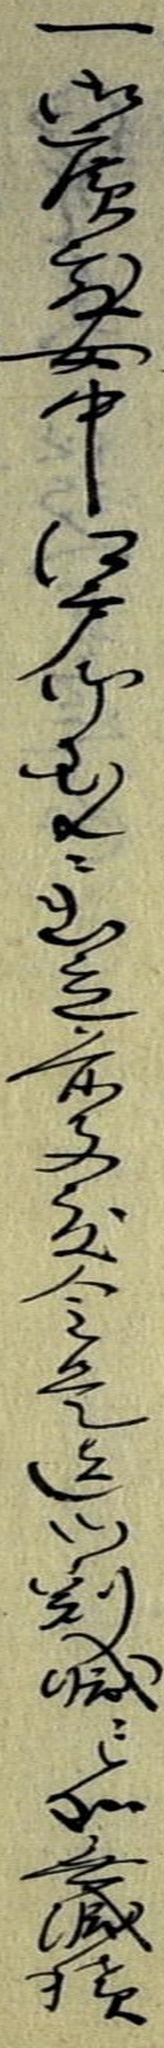一御広敷女中江戸御国共に出立前支度金是迄御割減に候処無減積
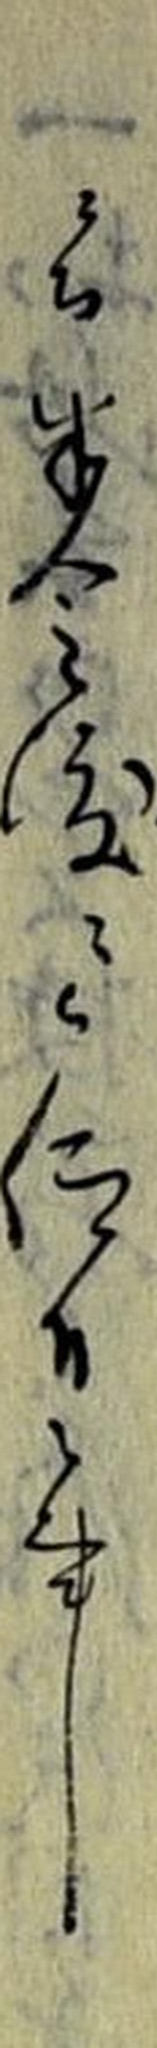に而半金渡に被仰付候事
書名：命令之部 二
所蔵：福井県文書館 Fukui Prefectural Archives
